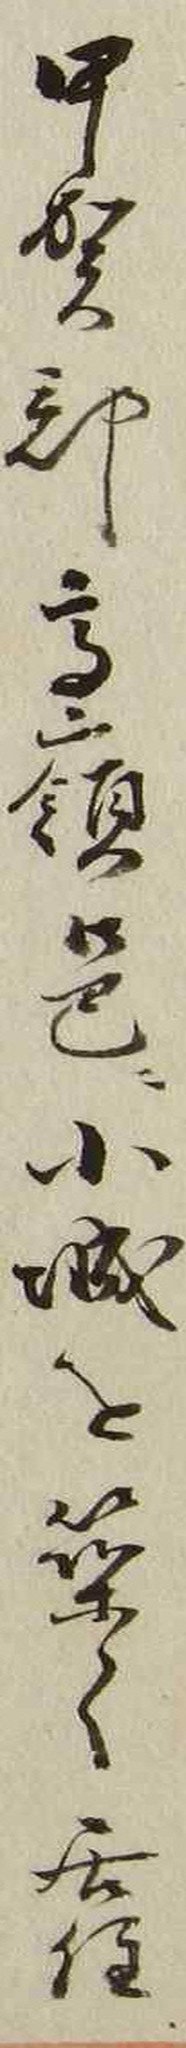甲賀郡高嶺邑ニ小城を築く居住
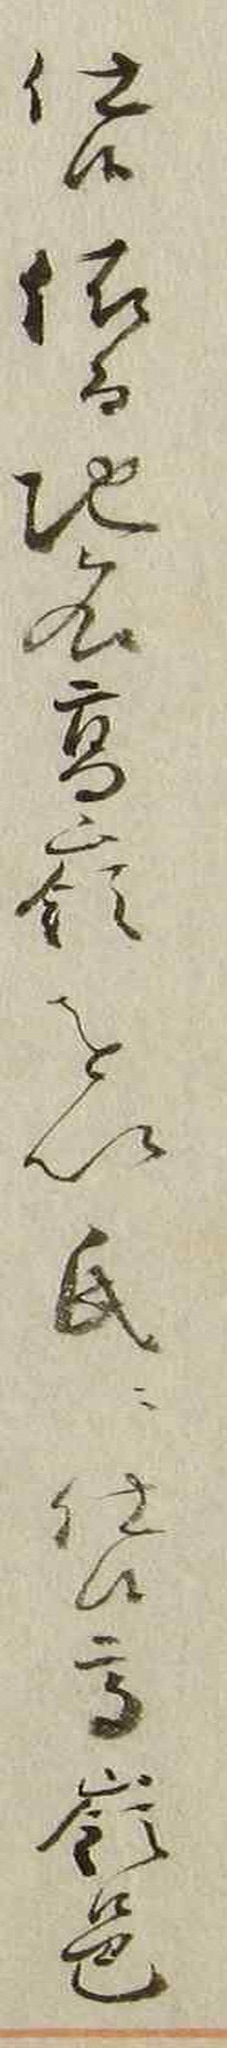仕候依而地名高嶺を以氏ニ仕候高嶺邑
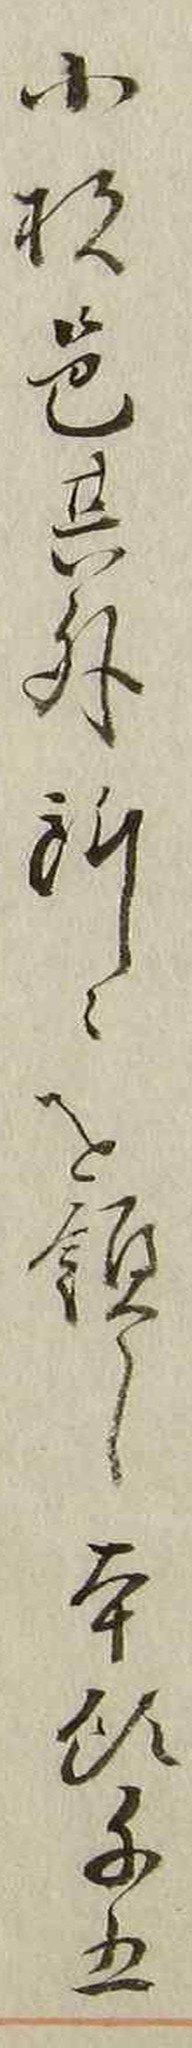小牧邑其外所々を領し本領千五
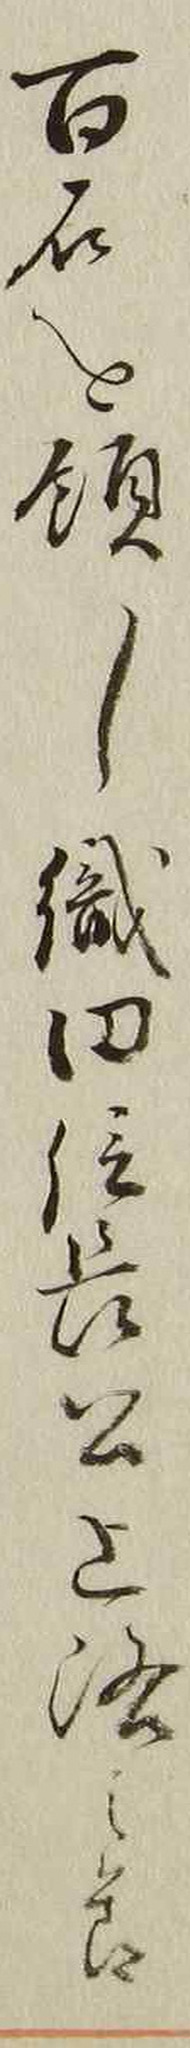百石を領し織田信長公上洛之節
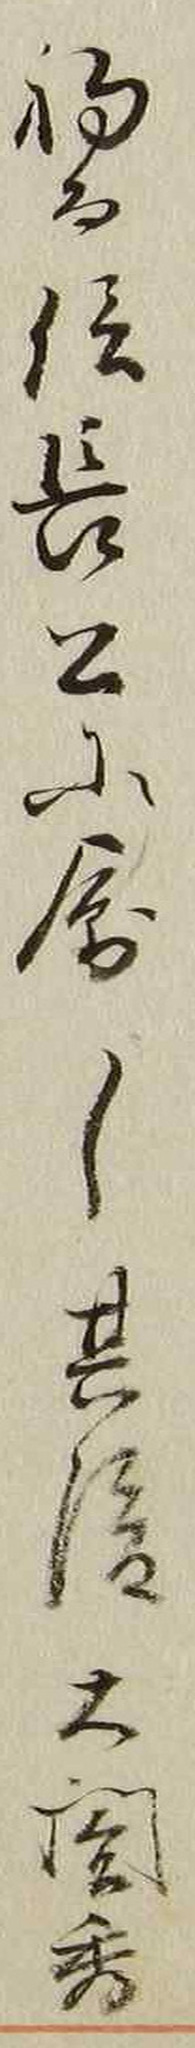初而信長公に属し其後大閤秀
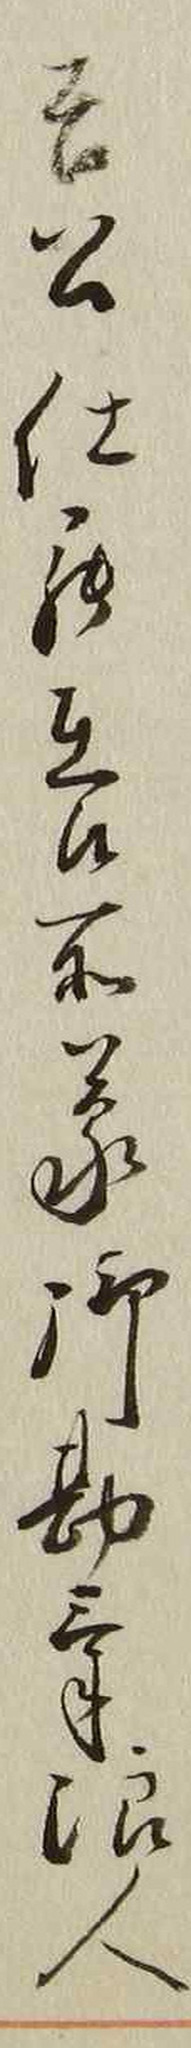吉公仕罷在候所蒙御勘気浪人
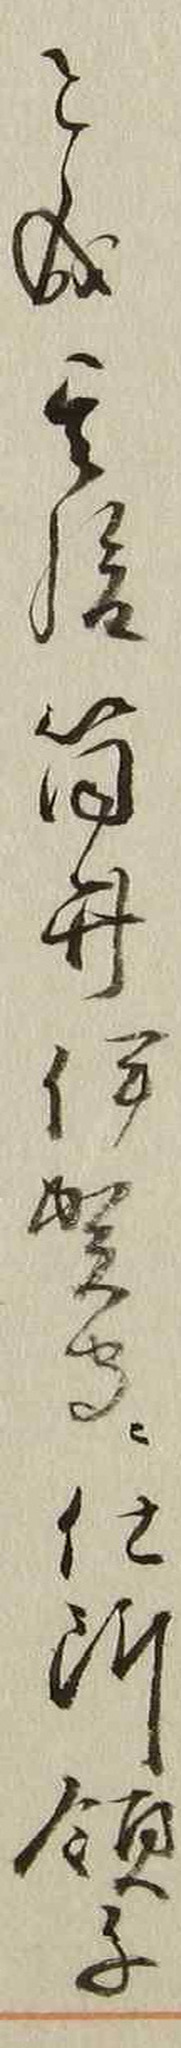と成其後筒井伊賀守ニ仕所領千
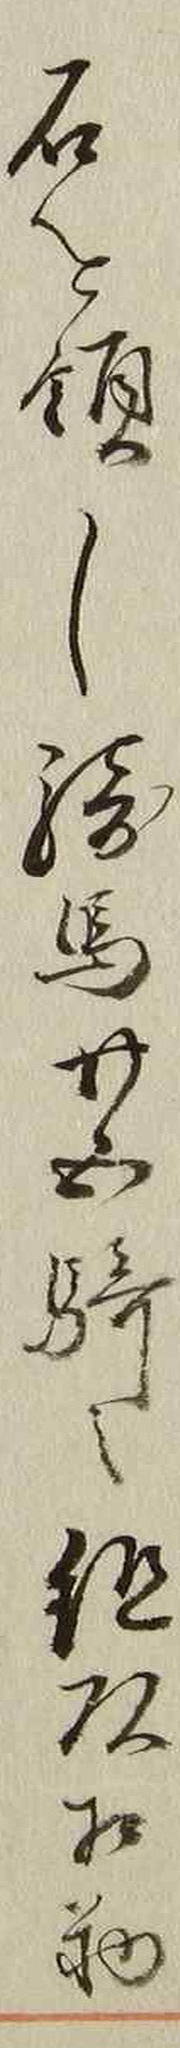石を領し騎馬廿五騎之組頭相勤
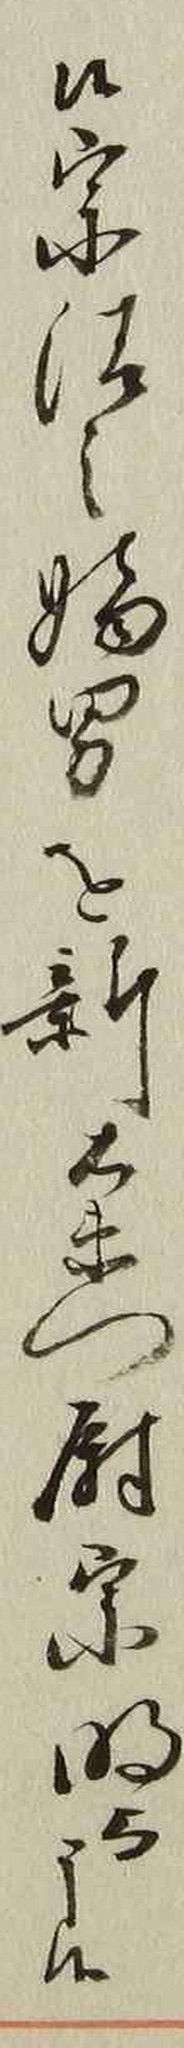候宗清之嫡男を新右衛門尉宗明与申候
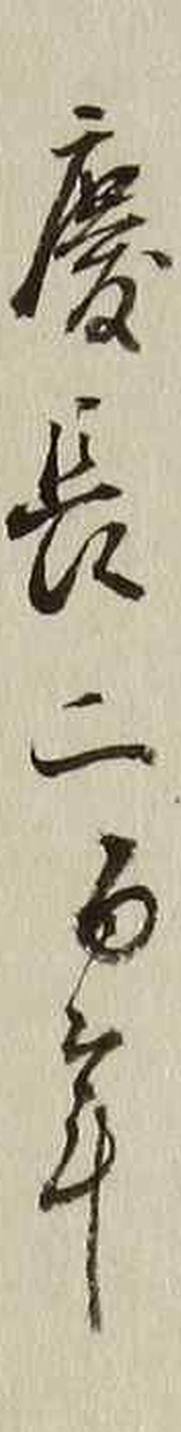慶長二酉年
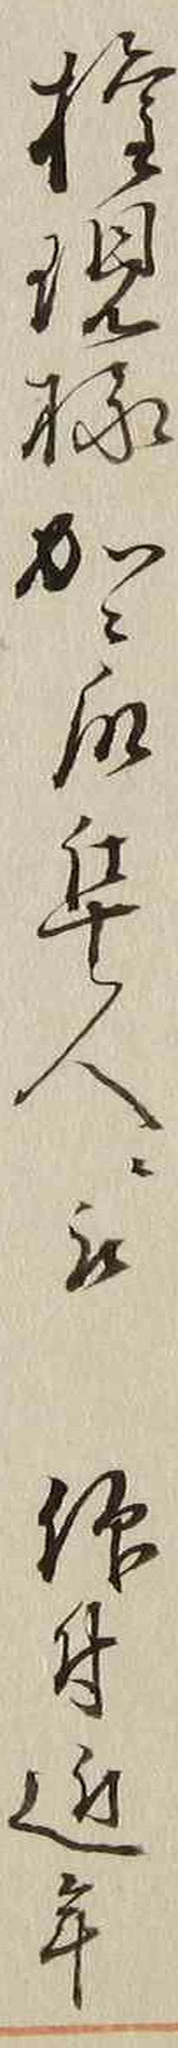権現様加々爪隼人ニ被仰付近年
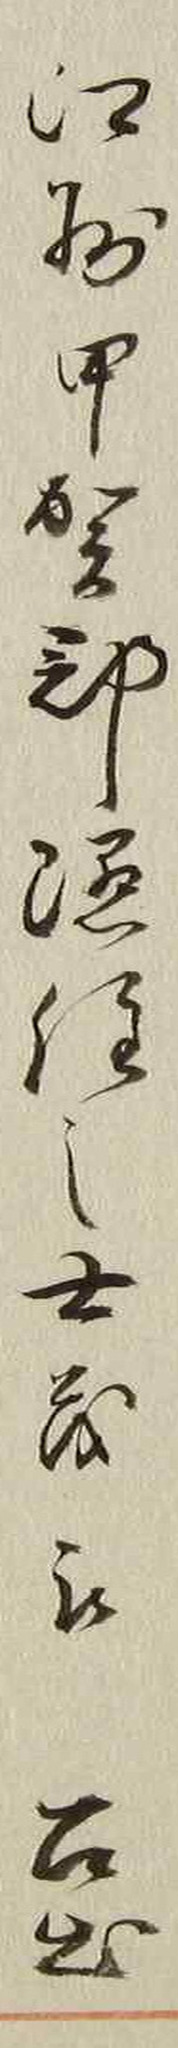江州甲賀郡隠住之士茂被召出
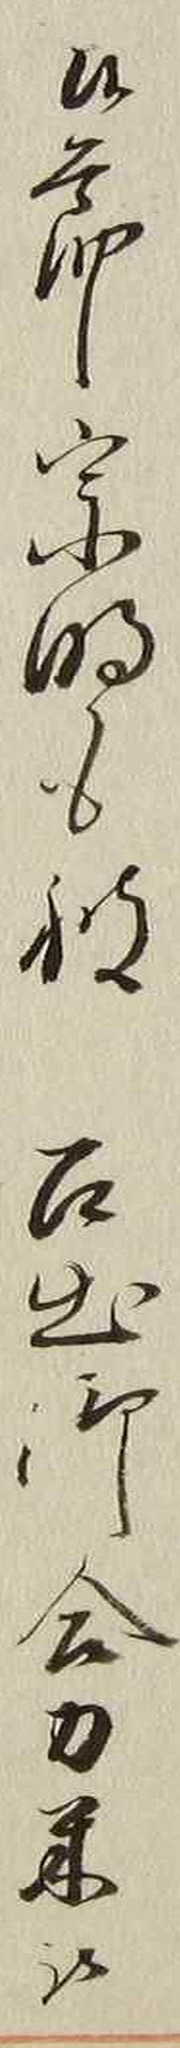候節宗明も被召出御合力米被
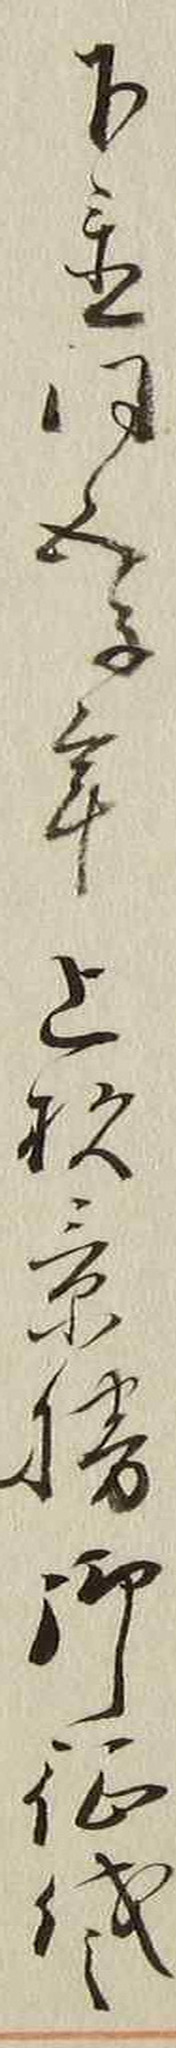下置同五子年上杉景勝御征伐之
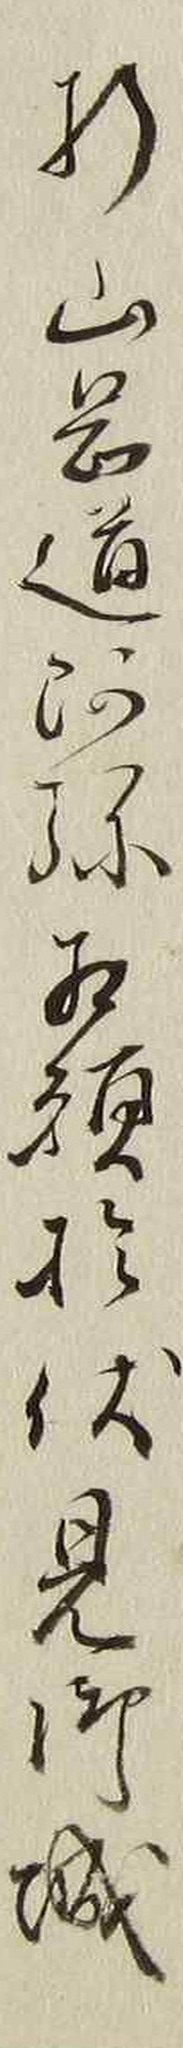折山岡道阿弥相頼於伏見御城
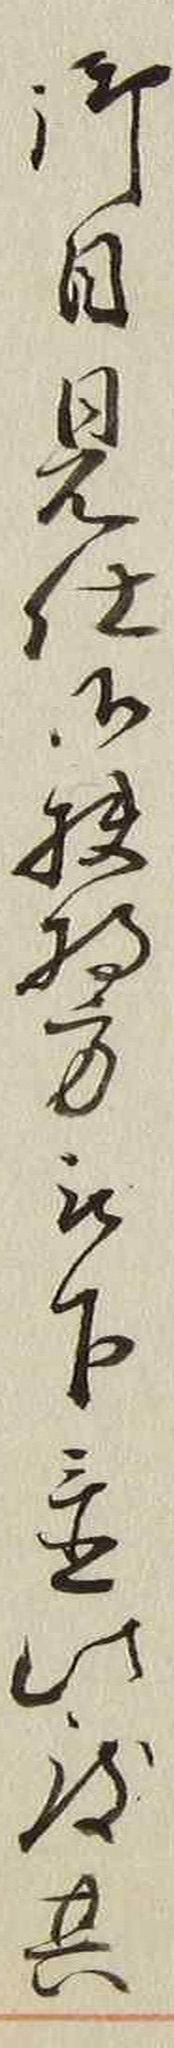御目見仕御扶持方被下置此度其
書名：諸士系譜　巻之141　た之部17
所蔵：会津若松市立会津図書館
